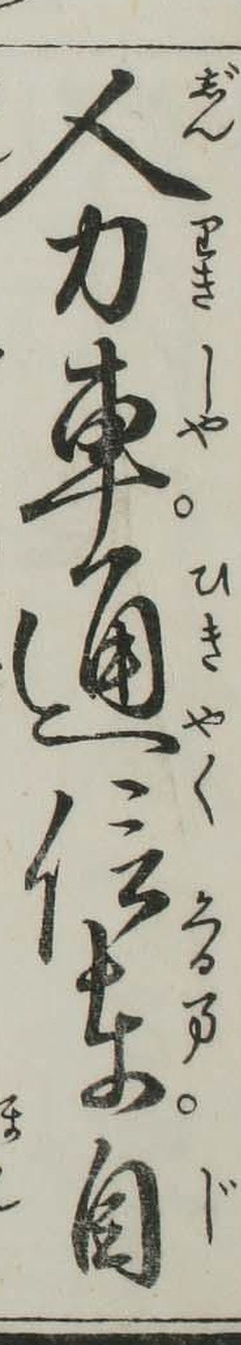人力車。通信車。自
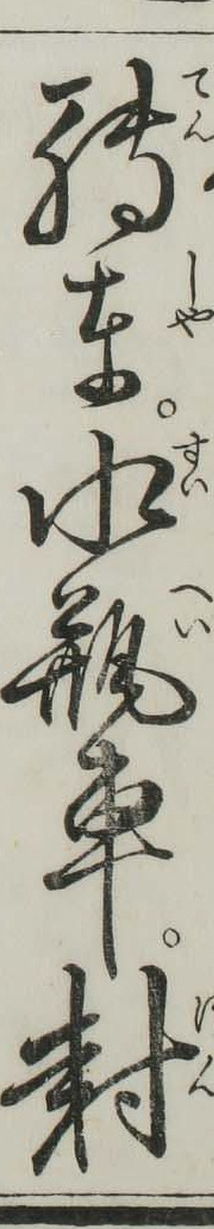転車。水瓶車。封
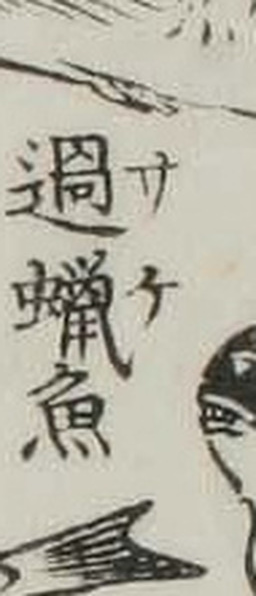過蝋魚
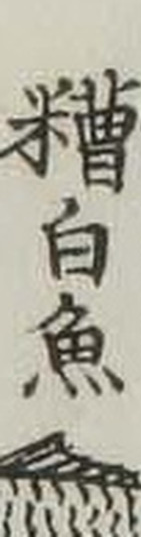糟白魚
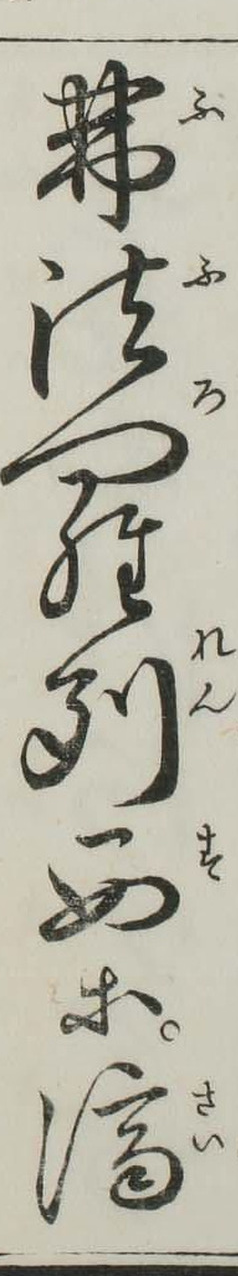弗法露列西等。済
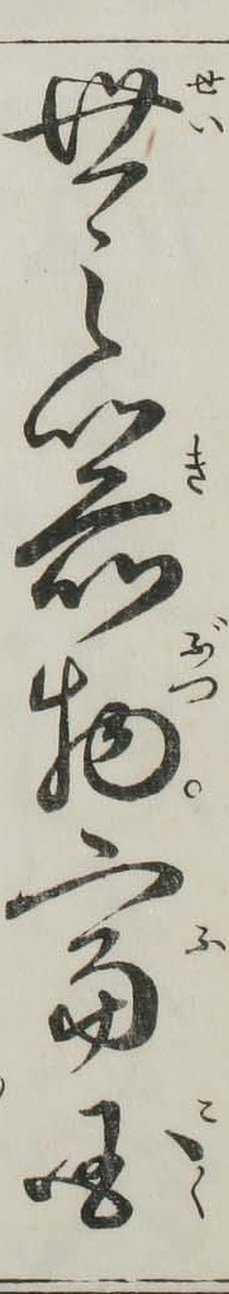世之器物。富国
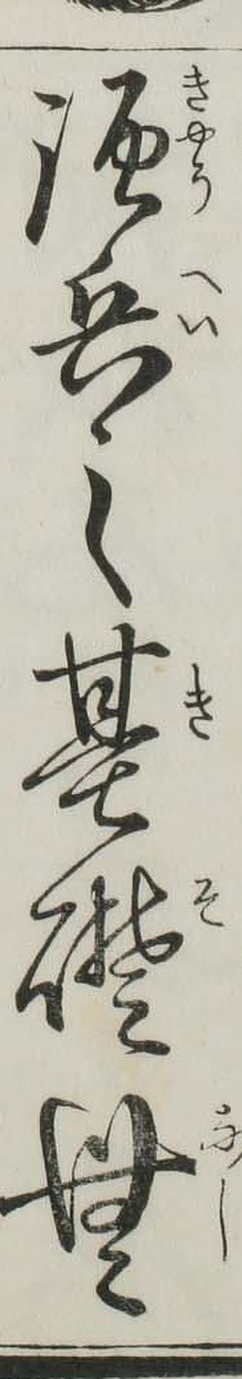強兵之基礎無
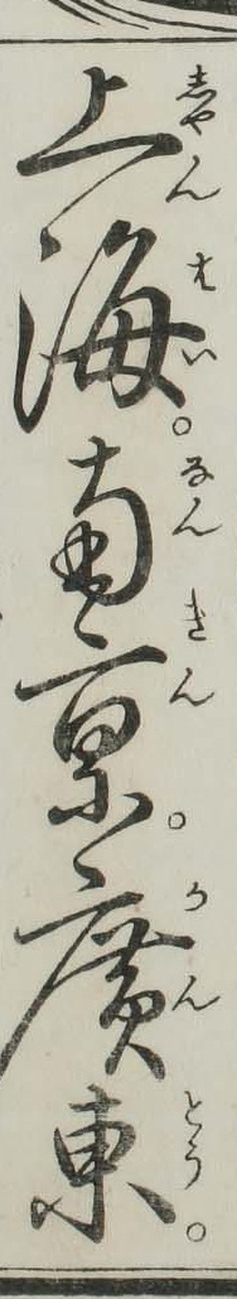上海。南京。広東。

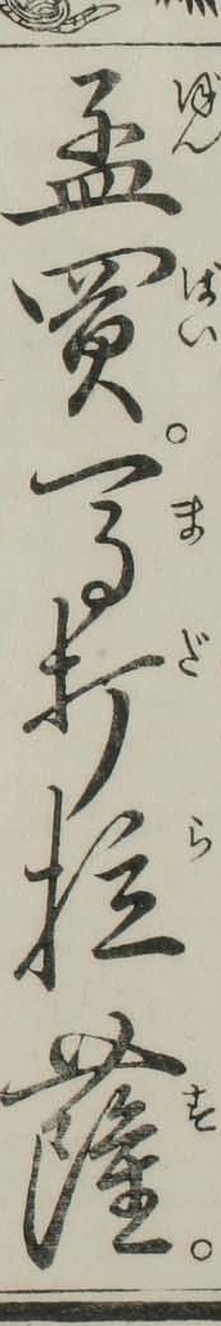孟買。馬打拉薩。
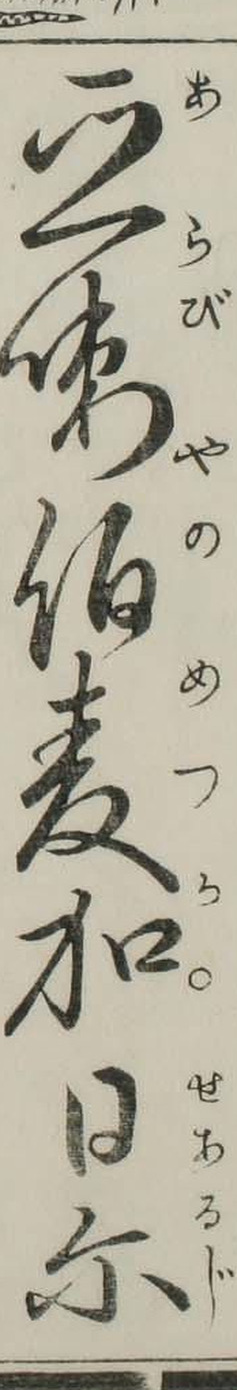亜喇伯麦加。日尓
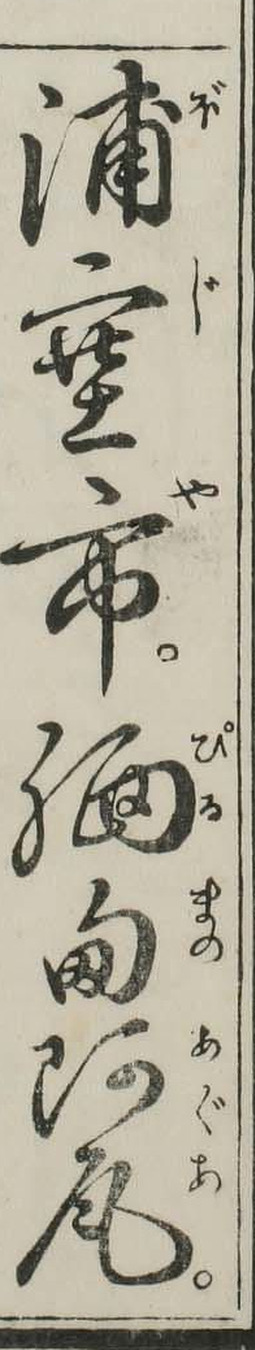浦寨市。緬甸阿瓦。
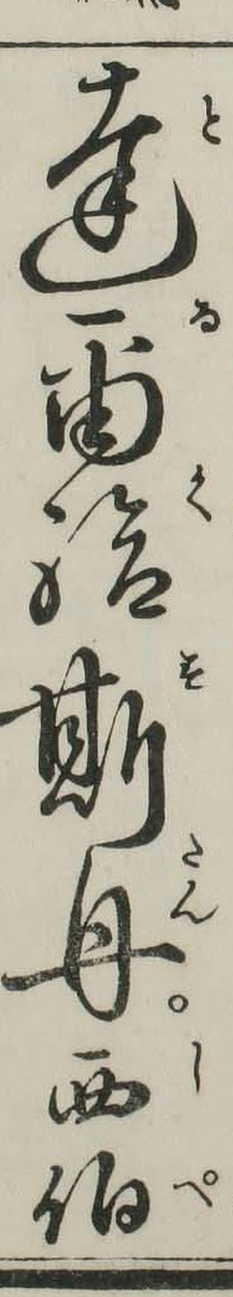達爾給斯丹。西伯
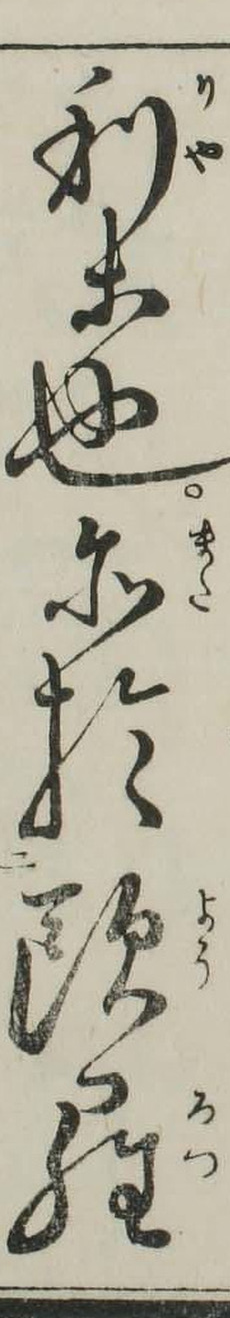利等也。亦於欧羅

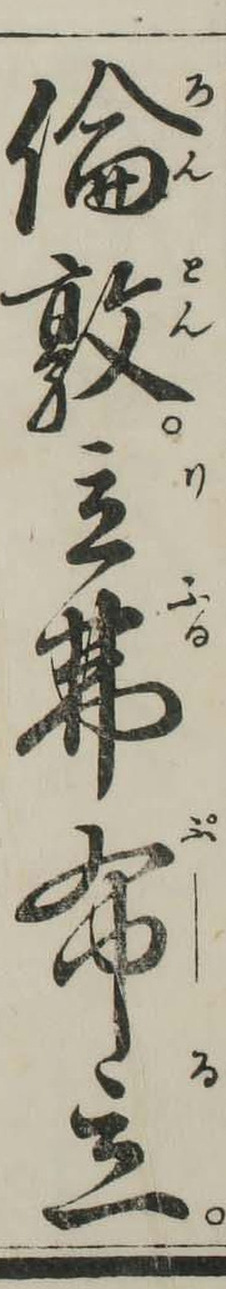倫敦。立弗布立。
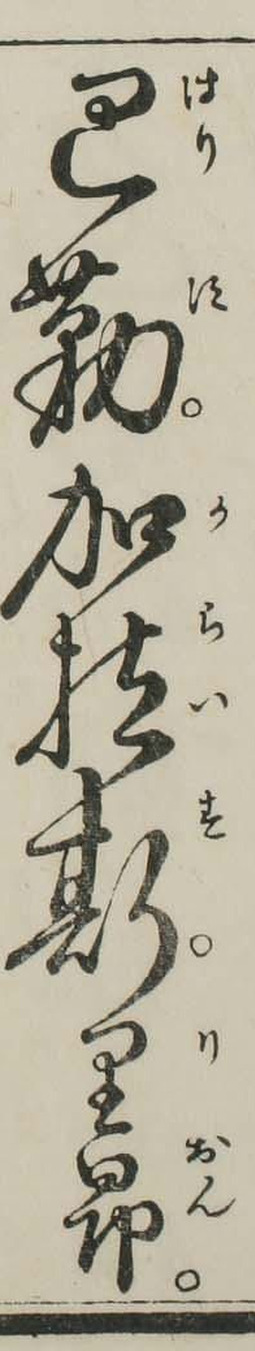巴勒。加拉斯。里昂。
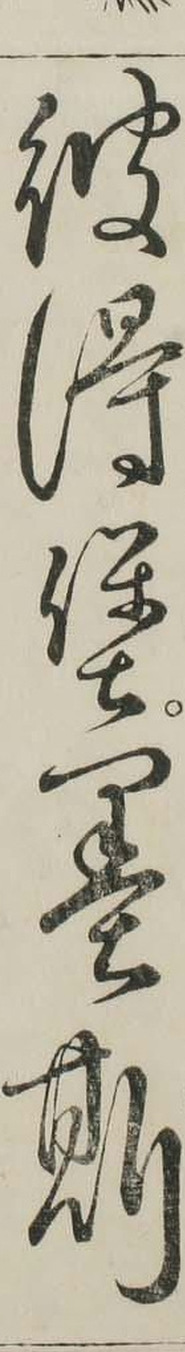彼得堡。墨斯
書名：開化往来
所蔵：東京学芸大学教育コンテンツアーカイブ
